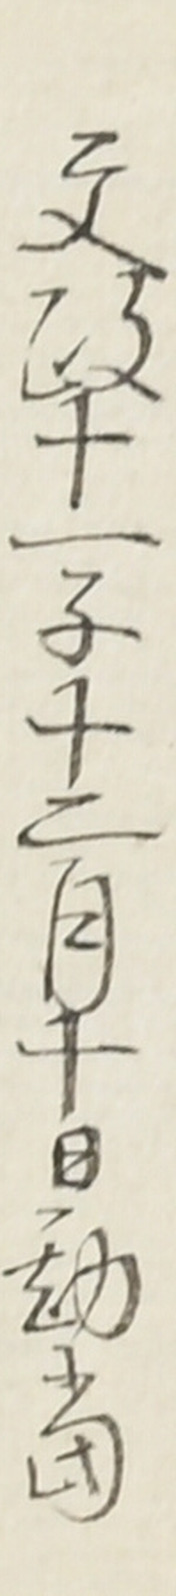一文政十一子十二月十日勘当
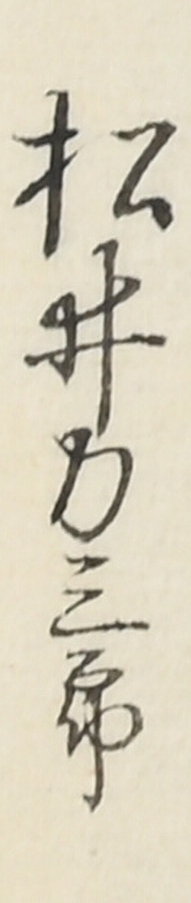松井力三郎

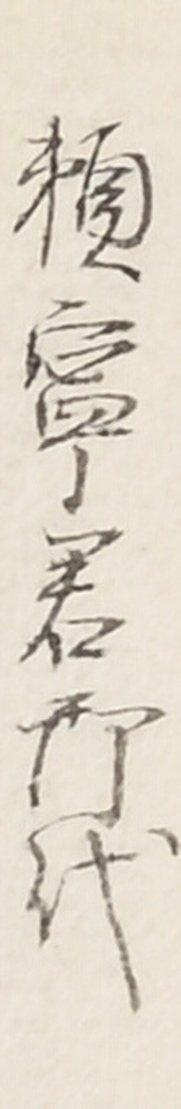頼寧君御代
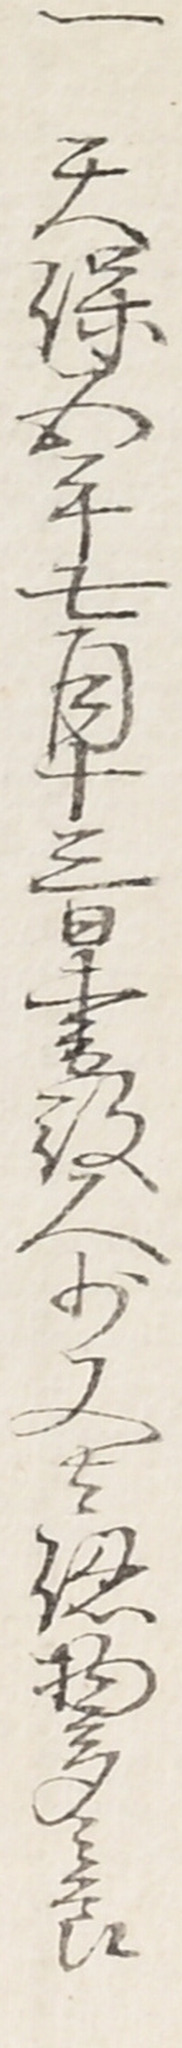一天保五午七月十三日書役人少又者認物多之節
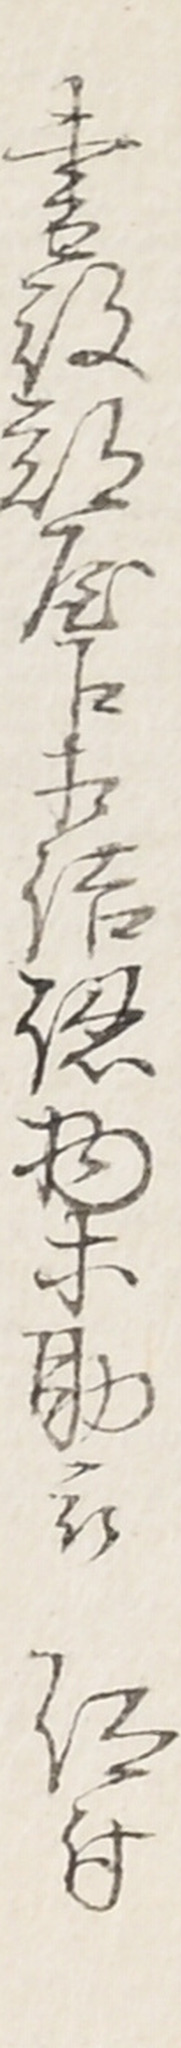書役部屋江相詰認物等助被仰付
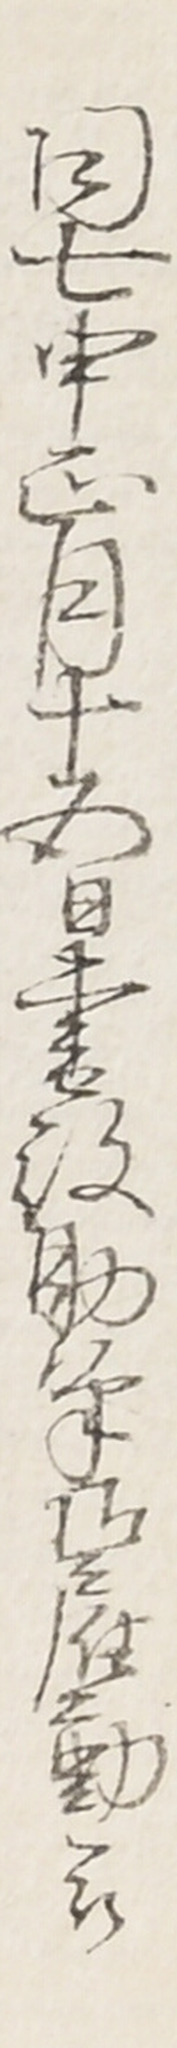一同七申正月十五日書役助筆御雇勤被
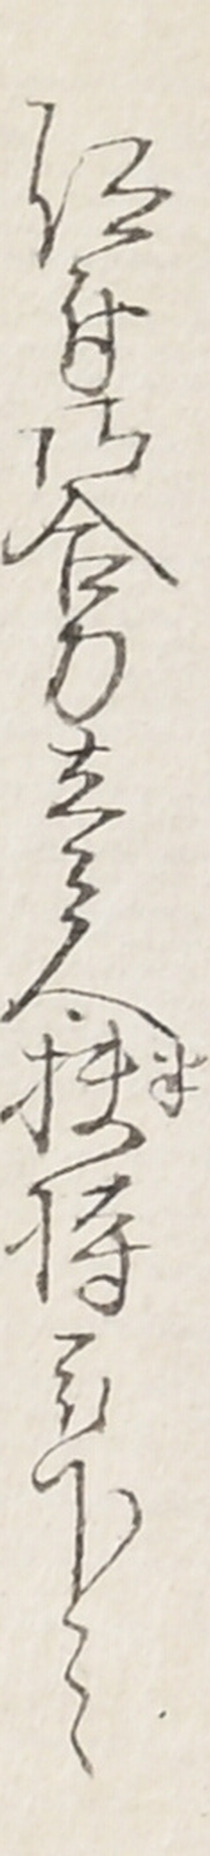仰付御合力壱人・扶持被下之
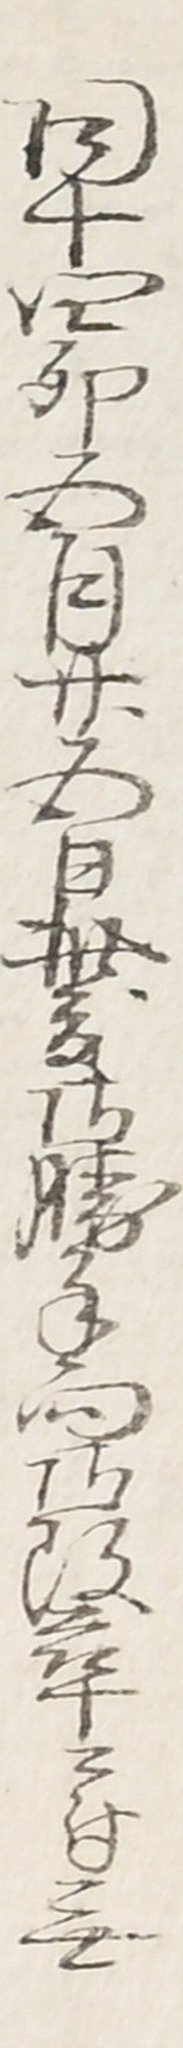一同十四卯五月廿五日此度御勝手向改革ニ付無
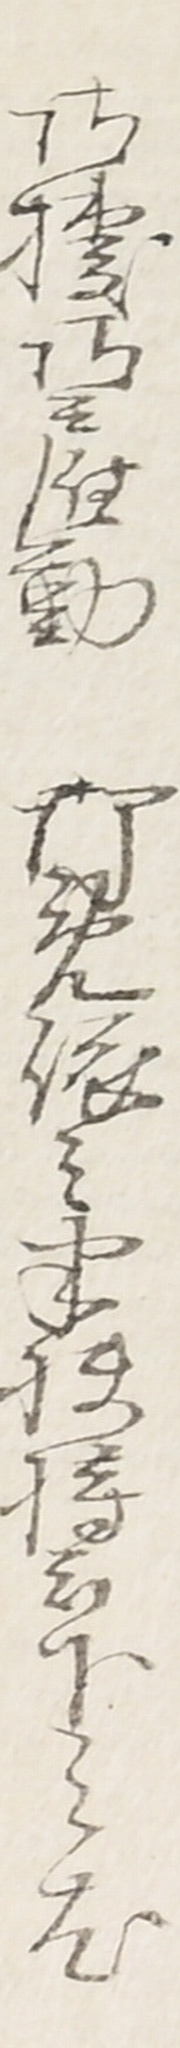御拠御雇勤御免依之半扶持被下之尤
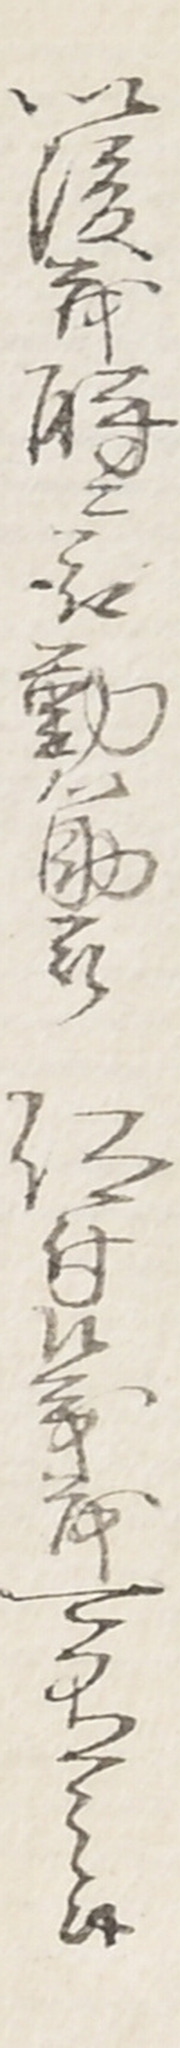以後茂時ニ取勤筋被仰付候義茂可有之候
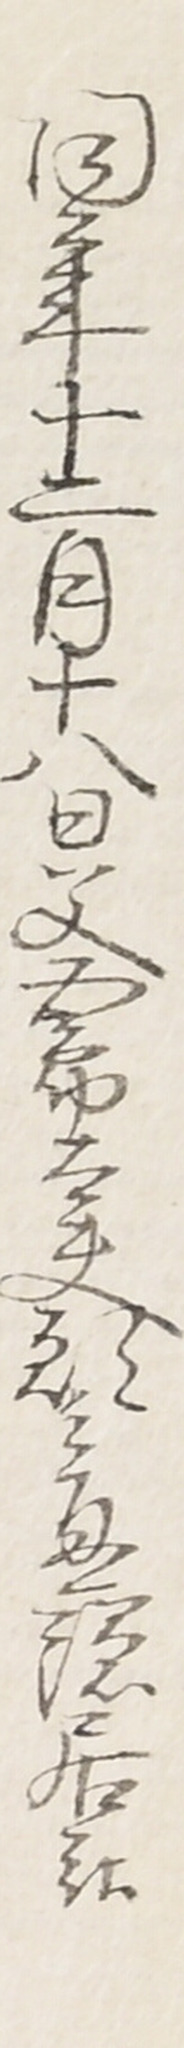一同年十二月十八日父五郎太夫願之通隠居被
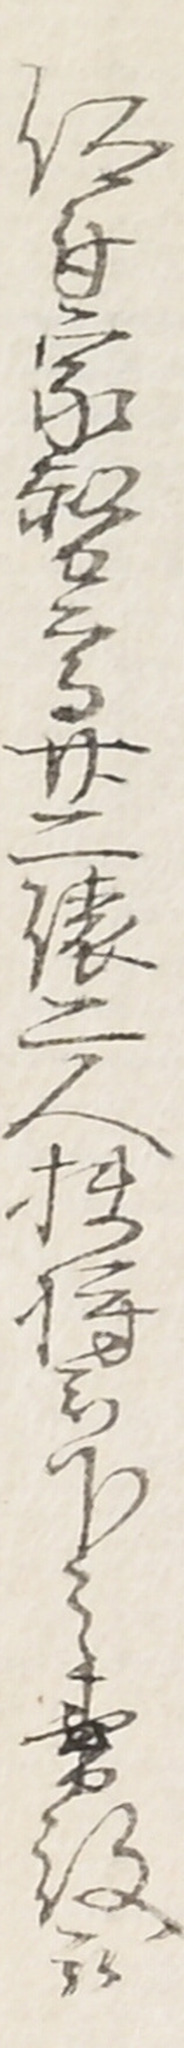仰付家督高廿二俵二人扶持被下之書役被
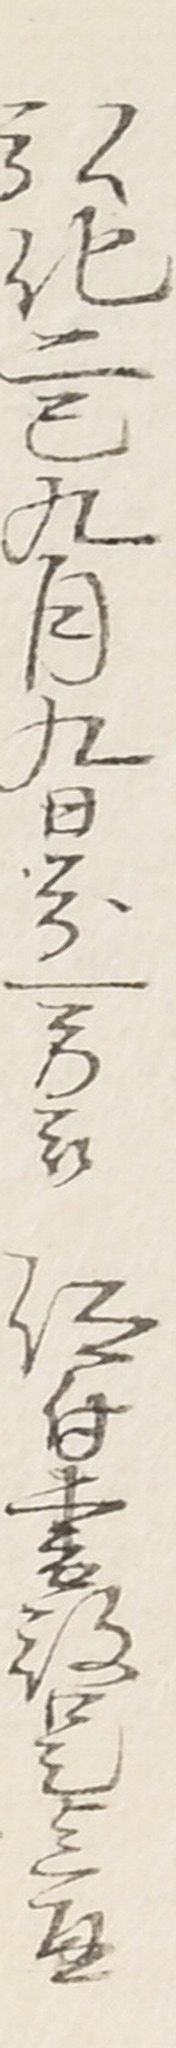一弘化二巳九月九日分一方被仰付書役是迄之通
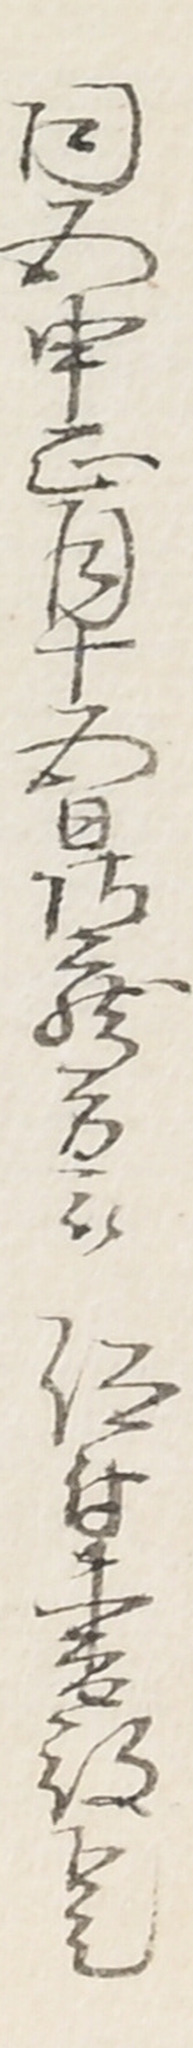一同五申正月十五日御蔵方被仰付書役是
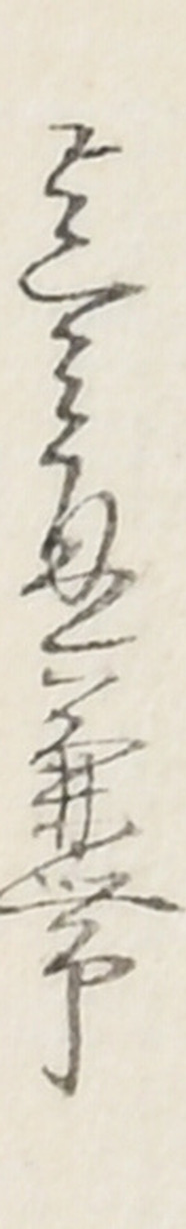迄之通兼帯
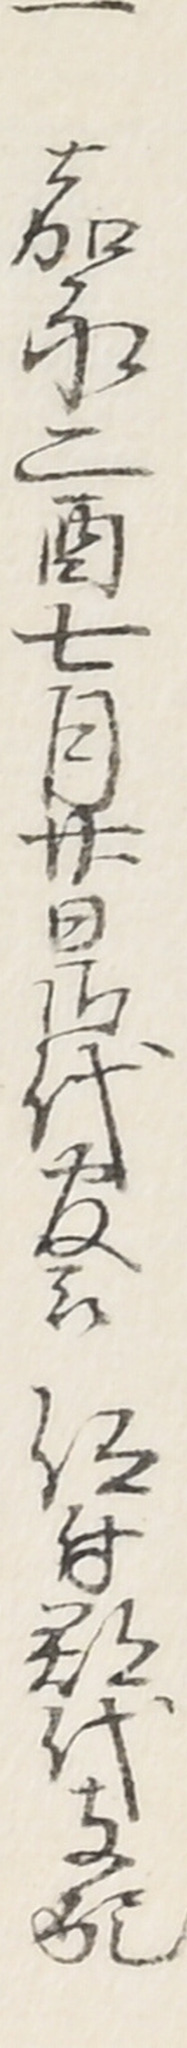一嘉永二酉七月廿日御代官被仰付郡代支配
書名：無足諸士勤仕録（四）
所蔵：伊那市立高遠町図書館・合同会社AMANE
